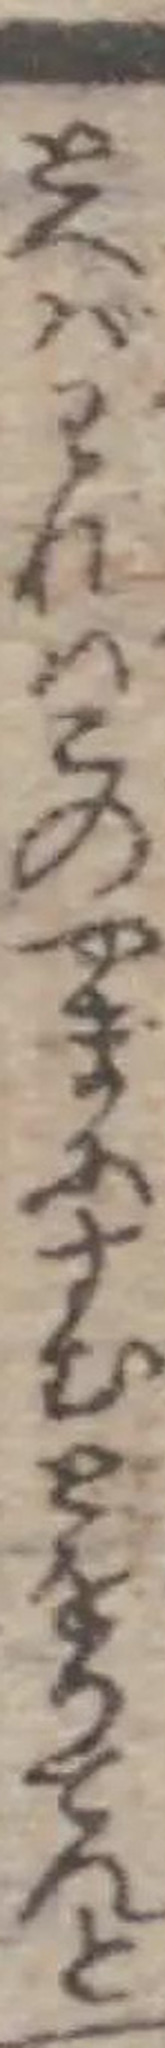とへばわれはこのやまにすむとをりてんと
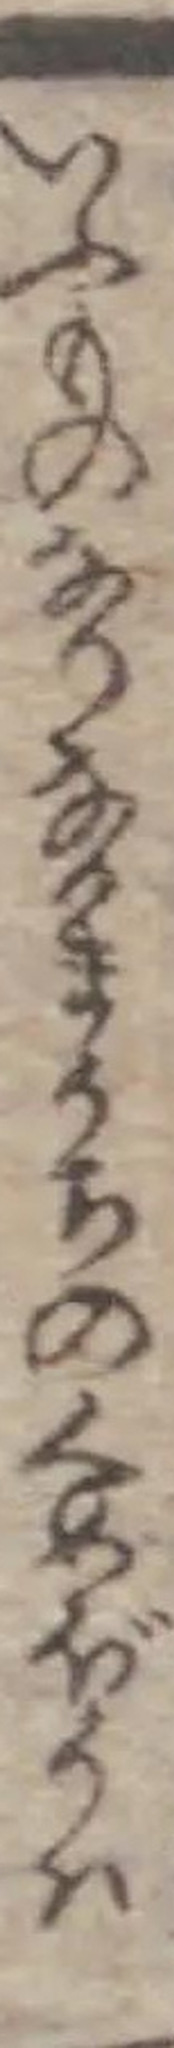いふものなりなかまうちのくめぼうは
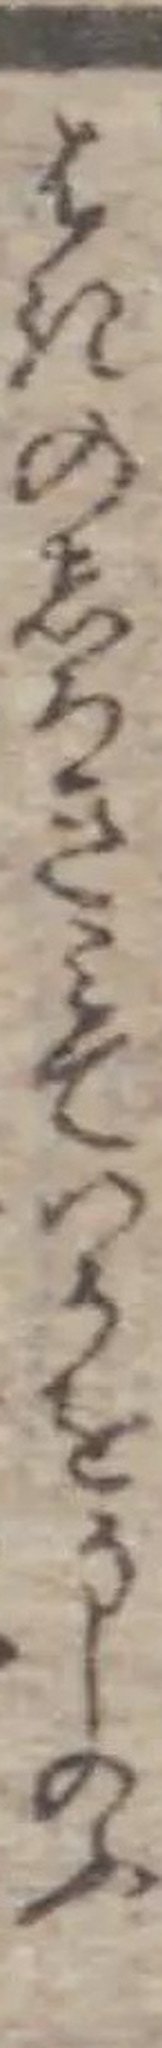はきのしろきみてつうをうしのふ
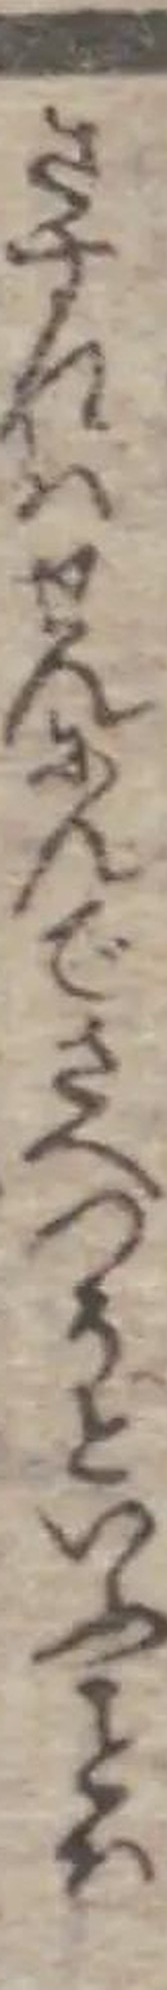さすれはせんにんでさへつうといふことは
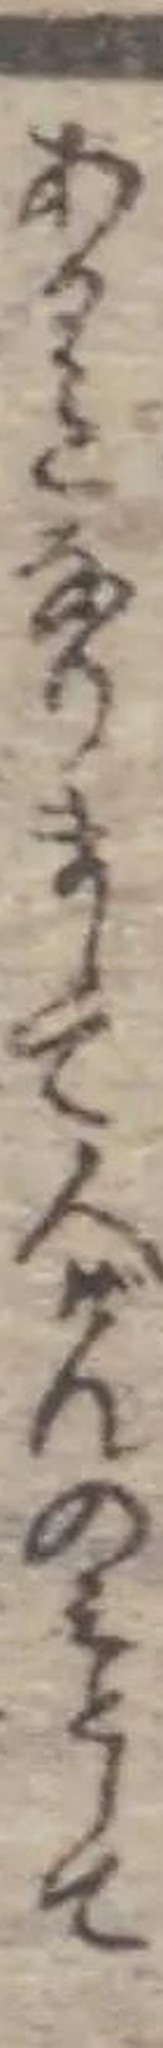あることなりまして人げんのみとして
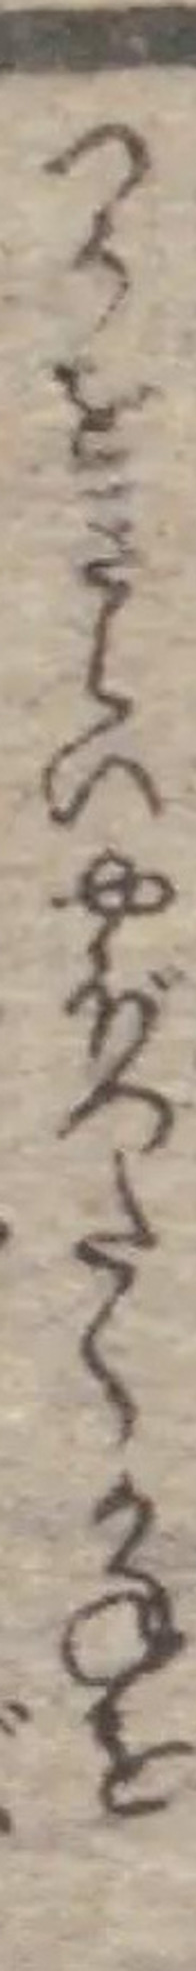つうをきらいやぼつたくかねを
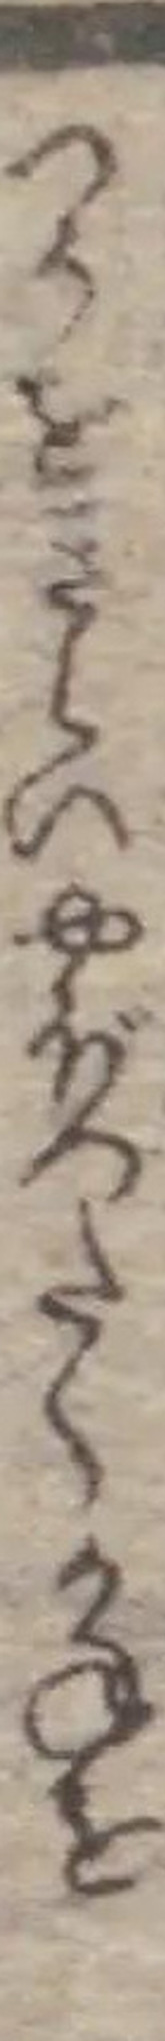つうをきらいやぼつたくかねを
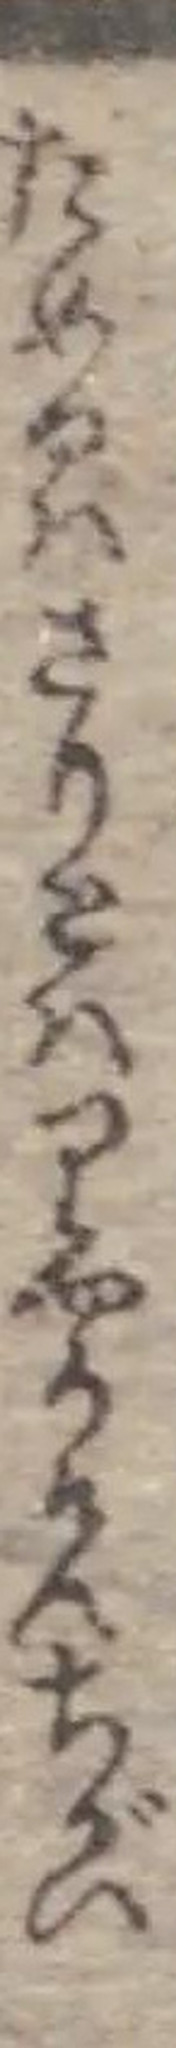ためるはさりとはりやうけんちがい
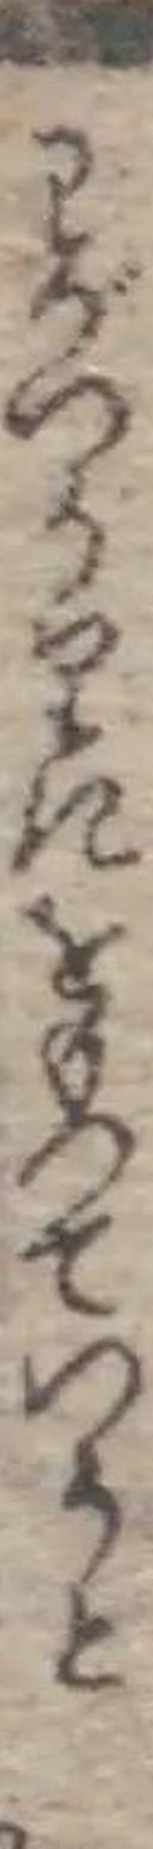わがつうりきをもつてつうと
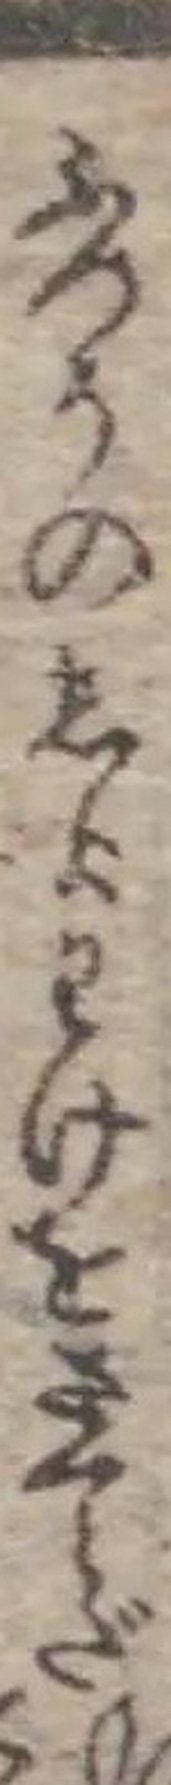ふつうのしよわけをさくみだ
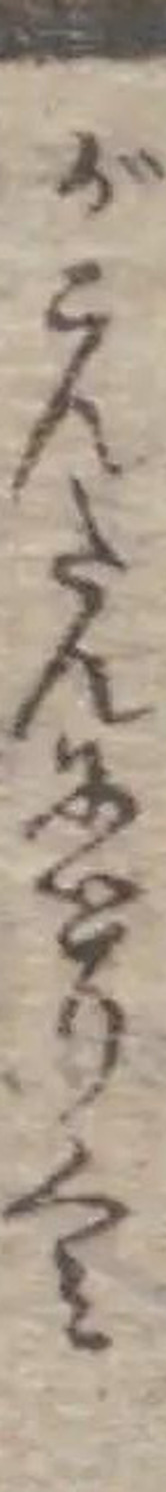がこんたんにとりくみ
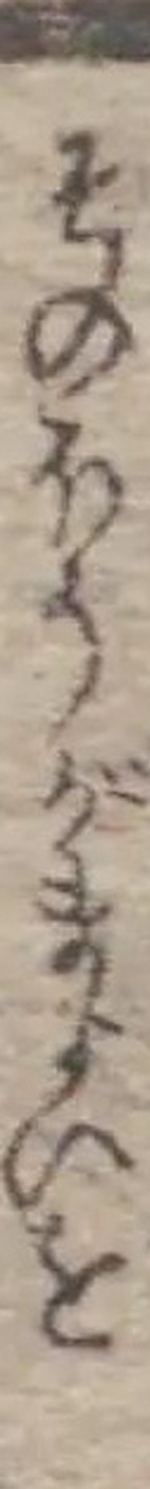そのほうがまよいを
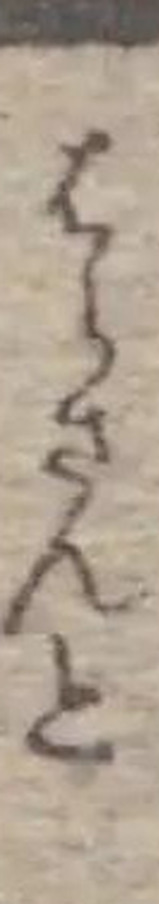はらさんと
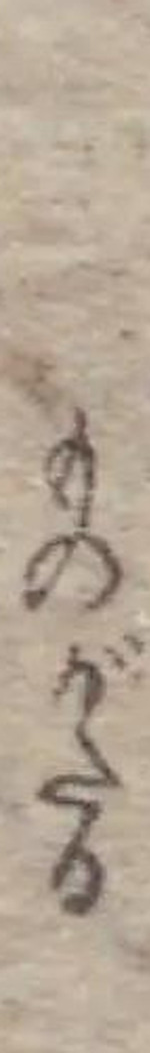ものがたる
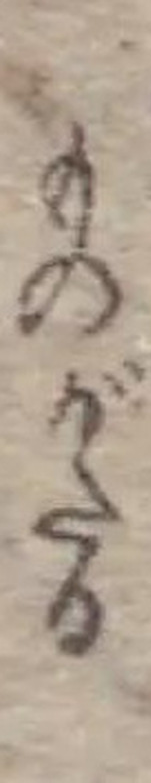ものがたる

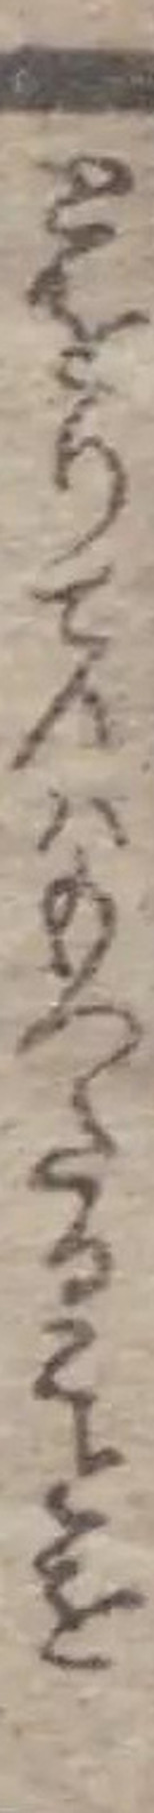とをりてんはもつたることを
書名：富多高慢噺 3巻
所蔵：国立国会図書館 National Diet Library, JAPAN
